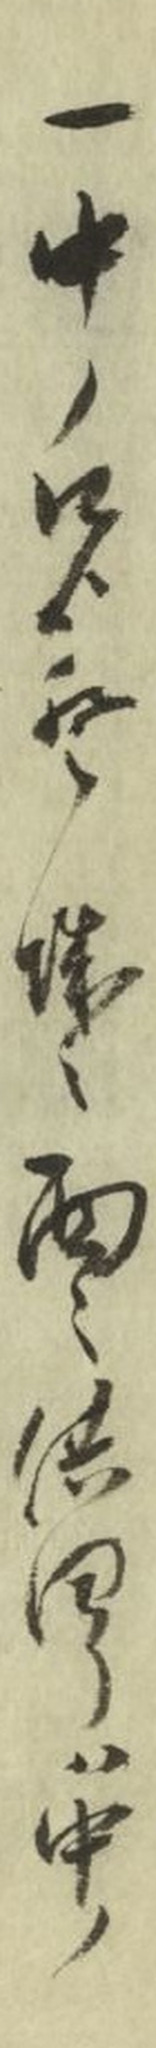一中の口ゟ登城之面々供回りは中の
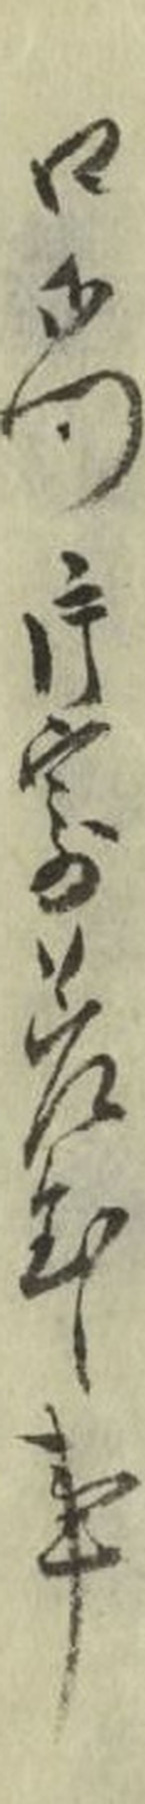口御門片寄差置之事
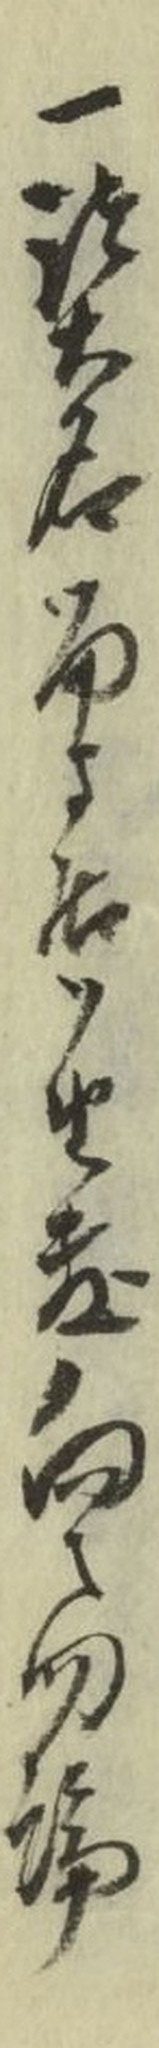一諸大名留守居御坐敷向は勿論
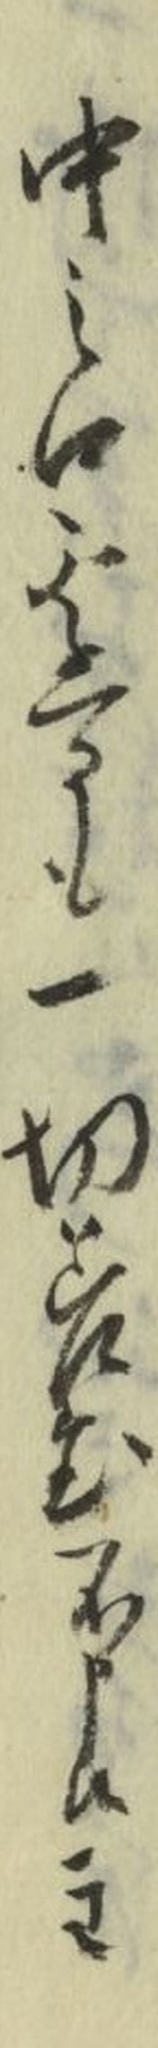中之口辺にも一切差置不申候主
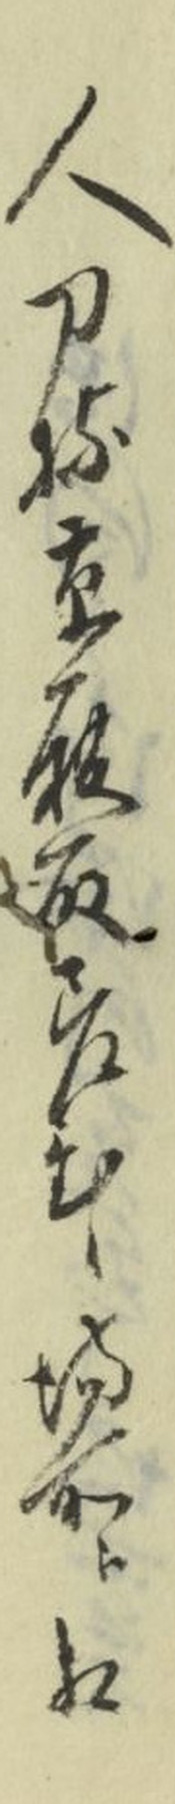人刀持草履取差置之場所え相
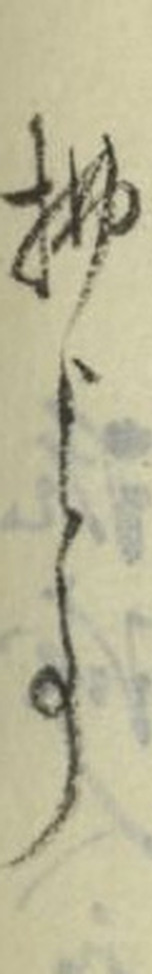払申候事
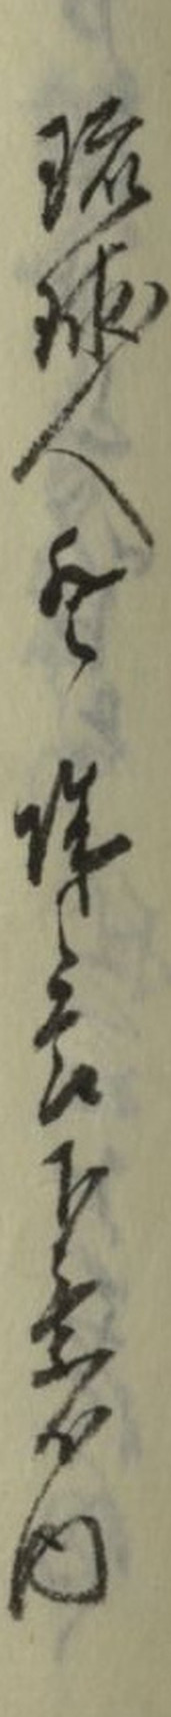琉球人登城之節下乗ゟ内
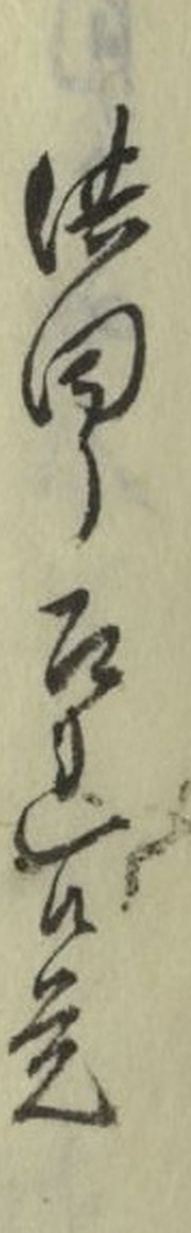供回り召連候覚
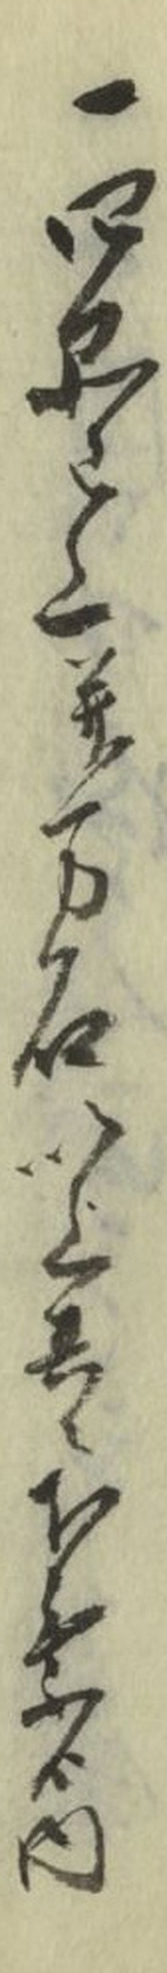一四品已上幷万石以上共に下乗ゟ内
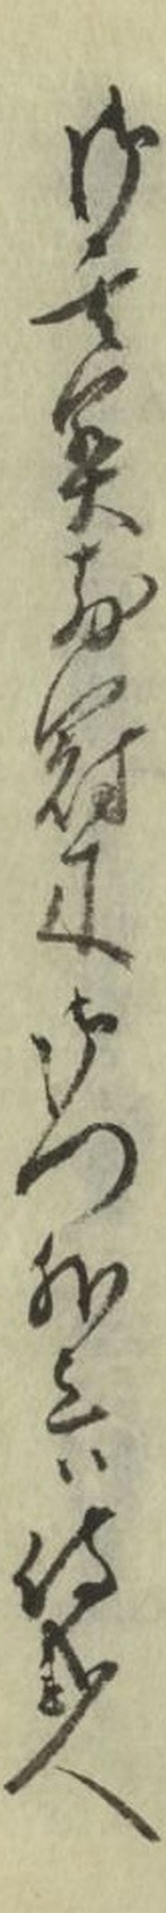御玄関前冠木御門外迄は侍弐人
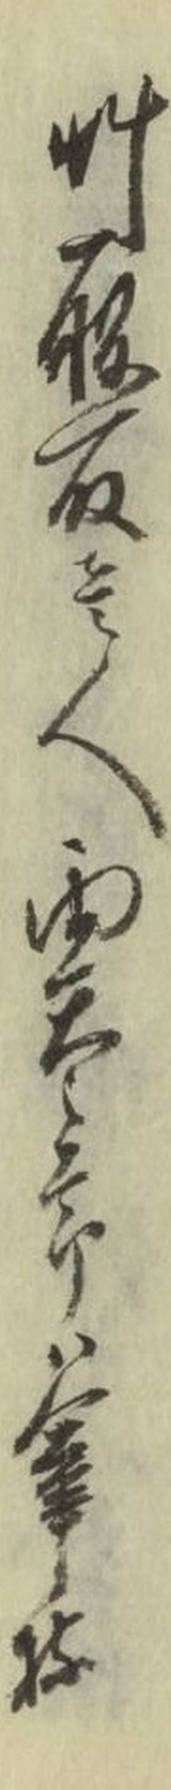草履取壱人雨天之節は傘持
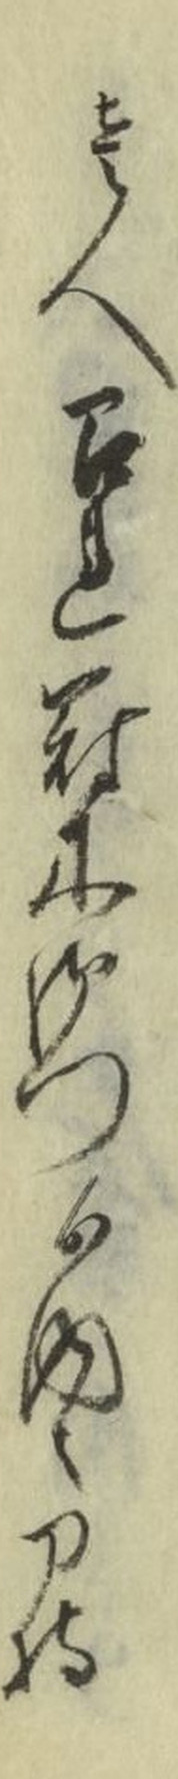壱人召連冠木御門ゟ内之刀持

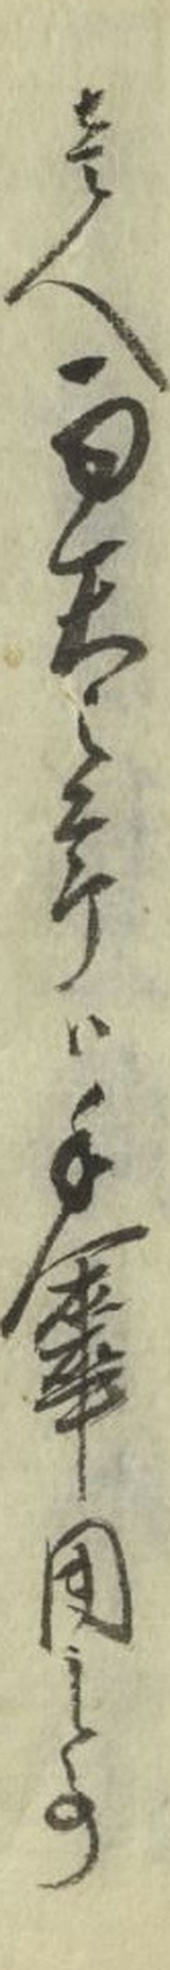壱人雨天之節は手傘用之事
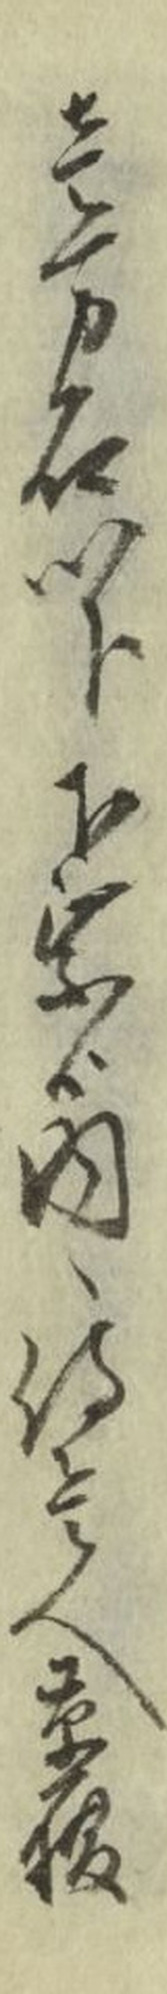壱万石以下下乗ゟ内へ侍壱人草履
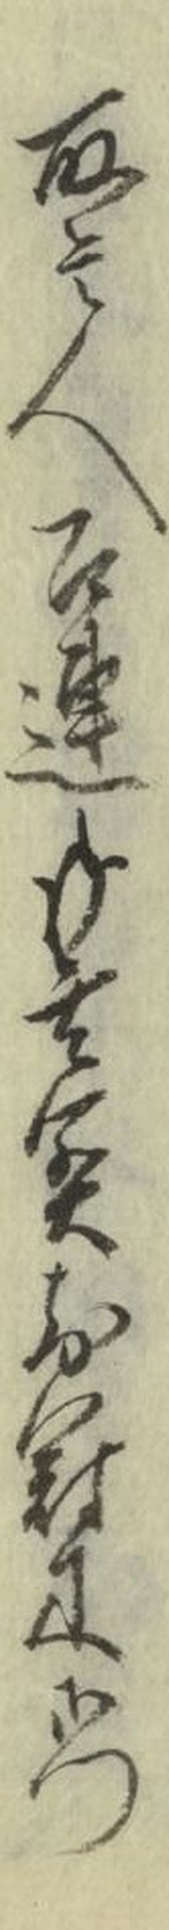取壱人召連御玄関前冠木御門
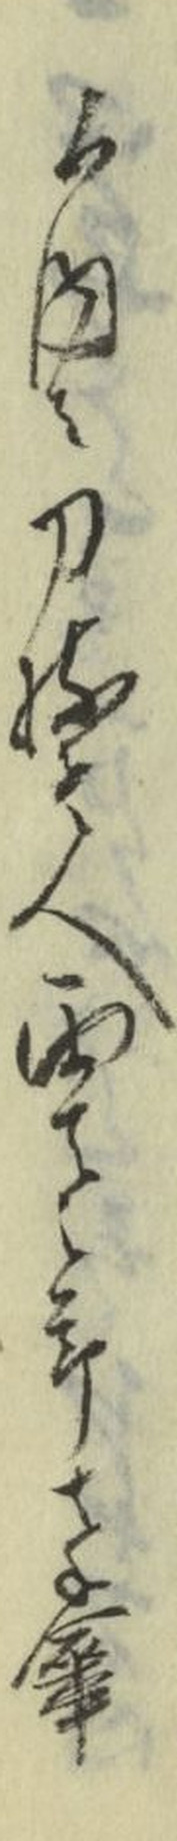ゟ内は刀持壱人雨天之節は手傘
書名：琉球人来朝記 四之五
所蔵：University of the Ryukyus Library
